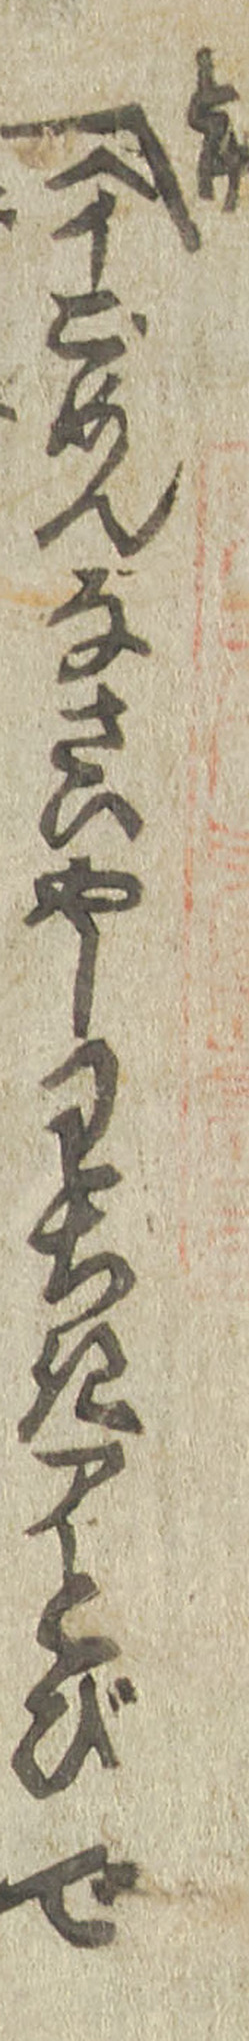「ヘイごめんなさいやしわちきアとびで
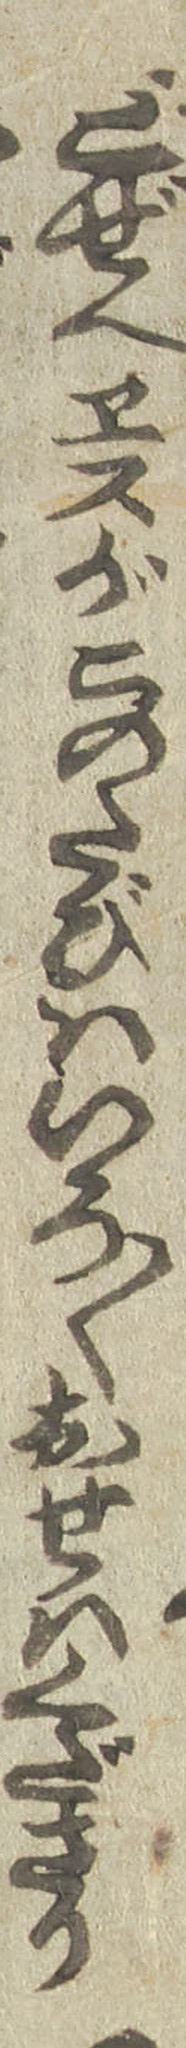ごぜへエスがこのたびはいろ〳〵おせはくださり
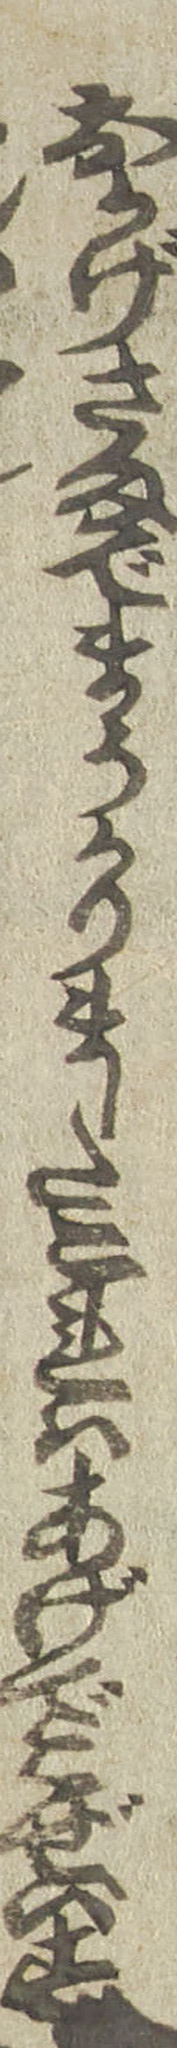おかげさまでまうかりましたこれはあげでこぜいす
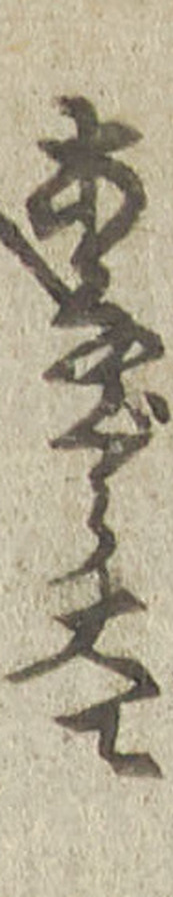あなぐら大工
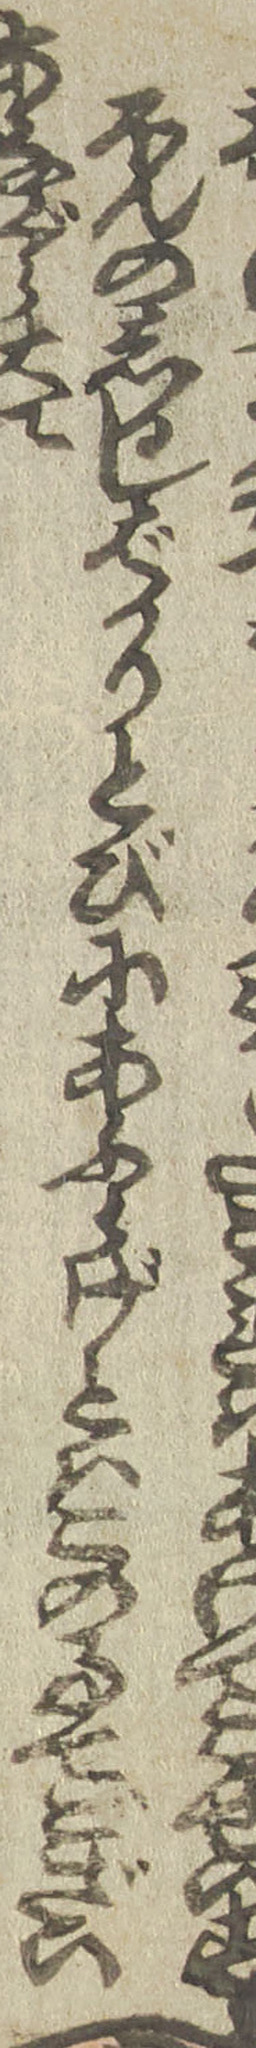ほんのしるしばかりとびにあふらげとはこの事てござい
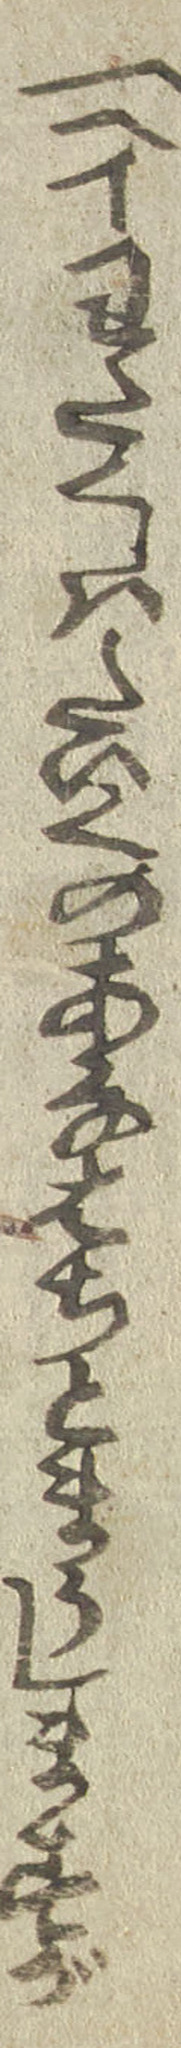「ヘイわたくしはたいくのあなはちとまうしますが
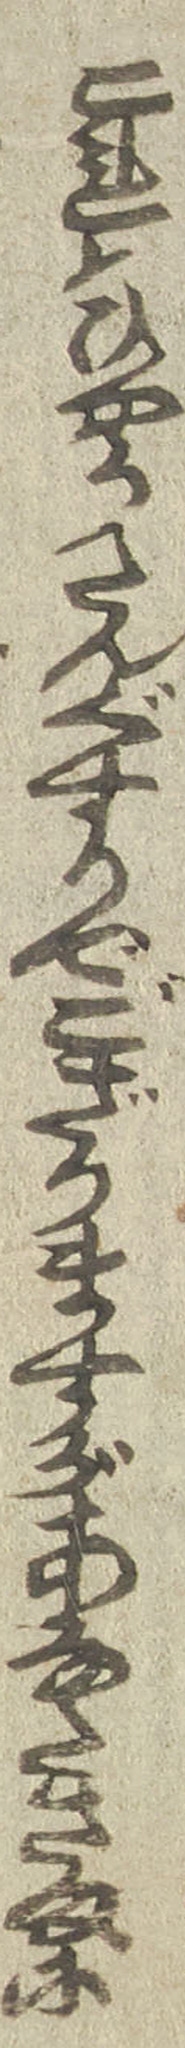これはひやうたんぐすりでござりますがあなたさまに
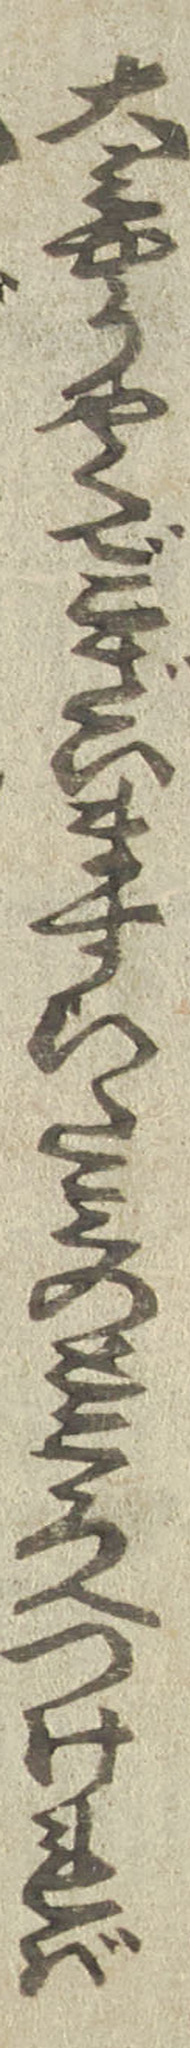大みやうやくでございますいたみのところへつければ
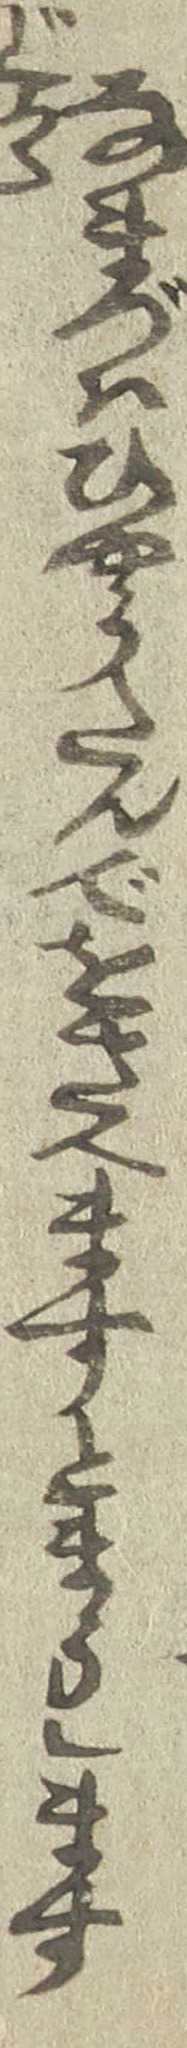なまずはひやうたんでをさへますとまうします
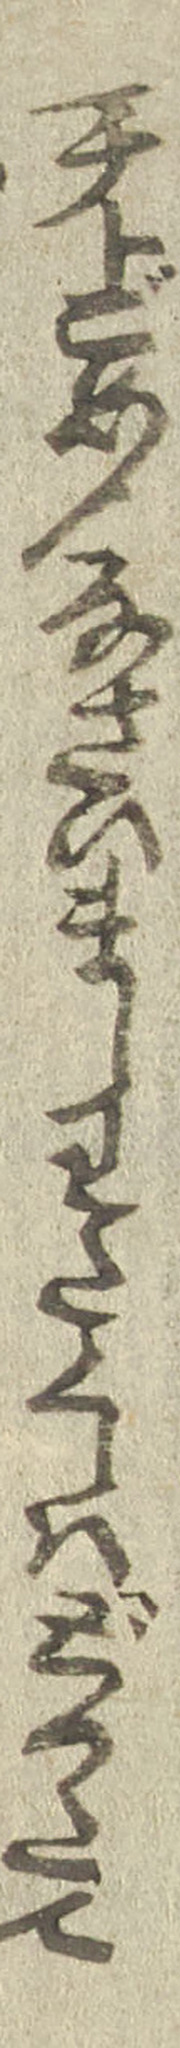「チトごめんなさいましわたくしはどかたて
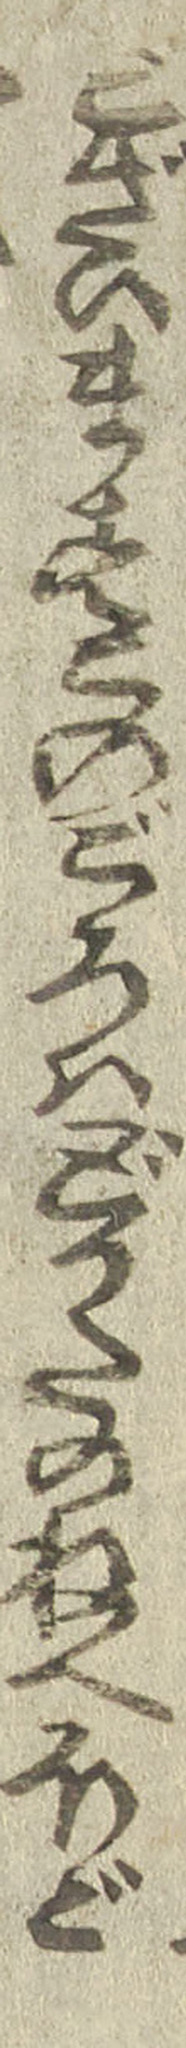ございますこのごろはどかたのねへほど
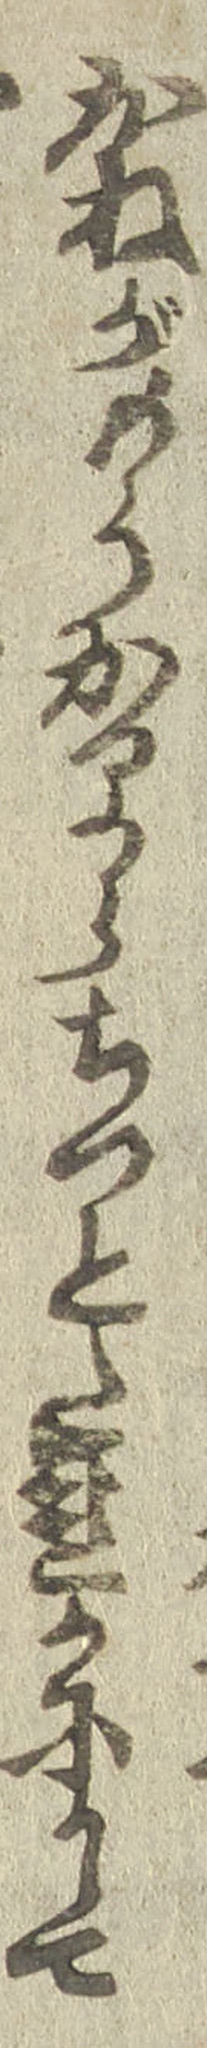かねがもうかるからちつとたれかにかして
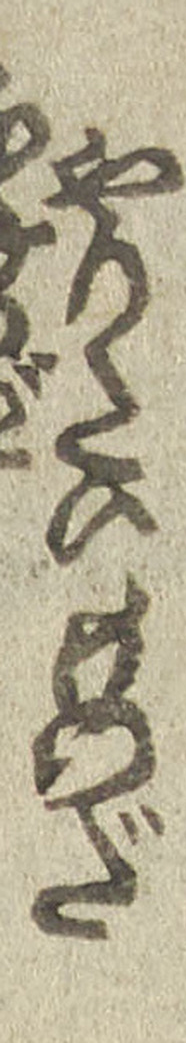やりたいものだ
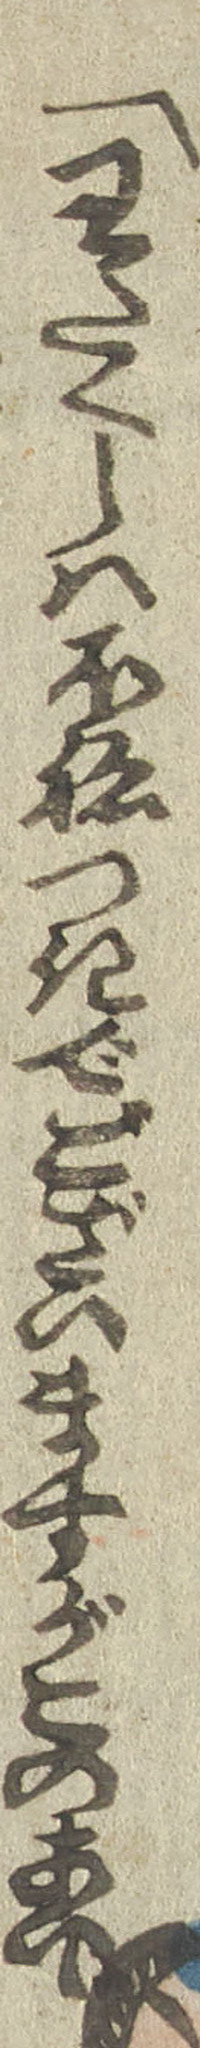「わたくしはほねつきでございますがこのあいた
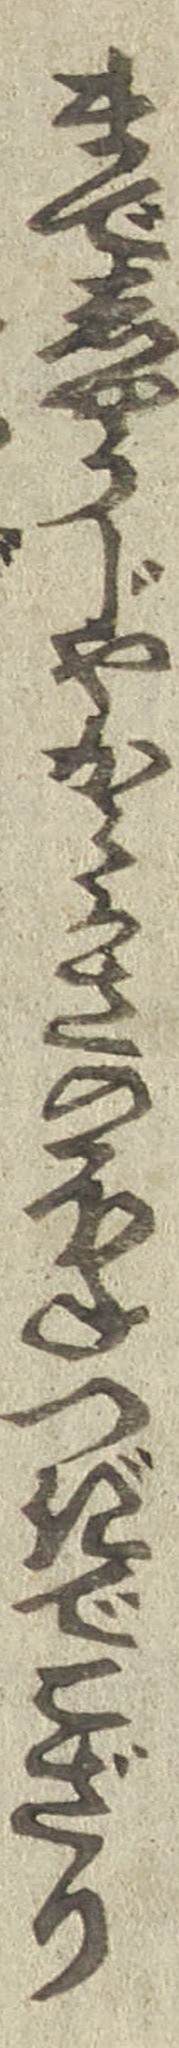までしやうじやからかさのほねつぎでこざり
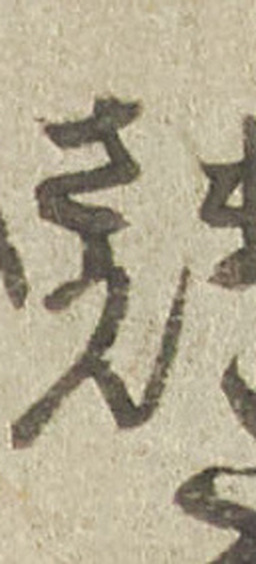さかん
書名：[病気鯰に諸職人見舞の図]
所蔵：東京大学総合図書館 General Library in the University of Tokyo, JAPAN
